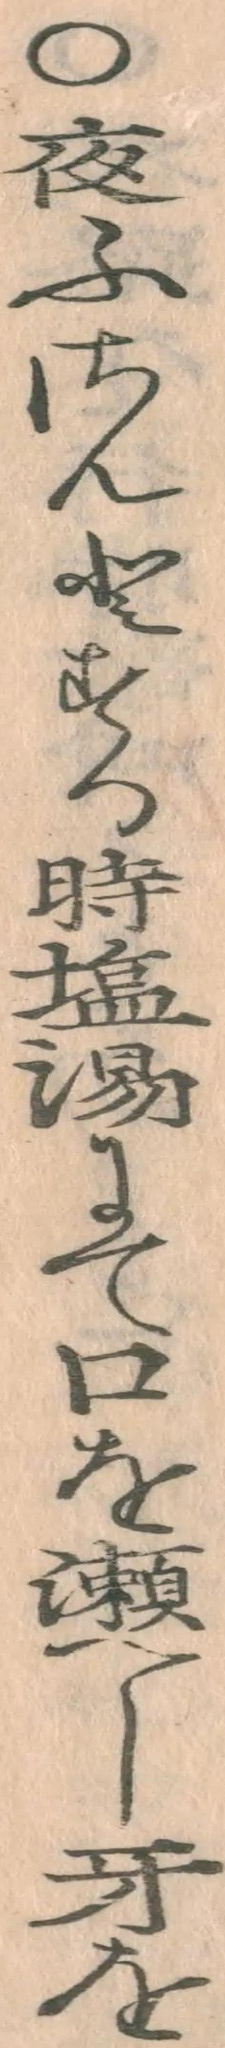〇夜ふさんとする時塩湯にて口を瀬へし牙を
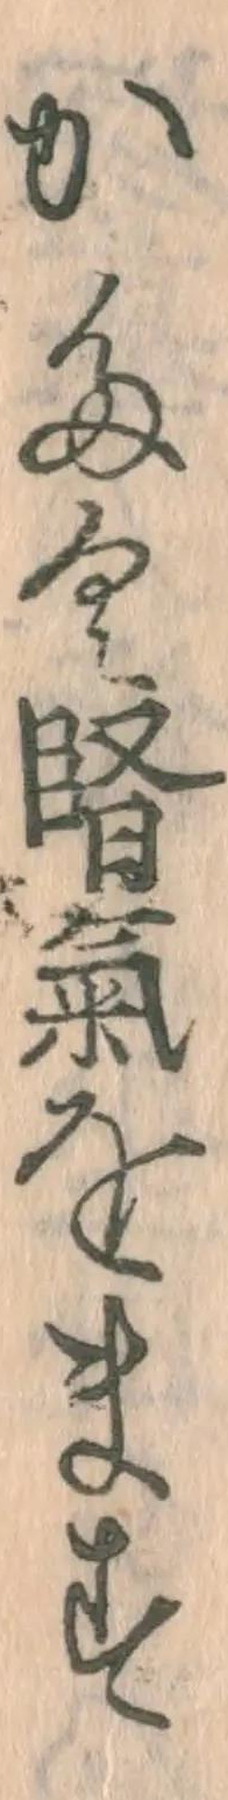かたく腎気をます
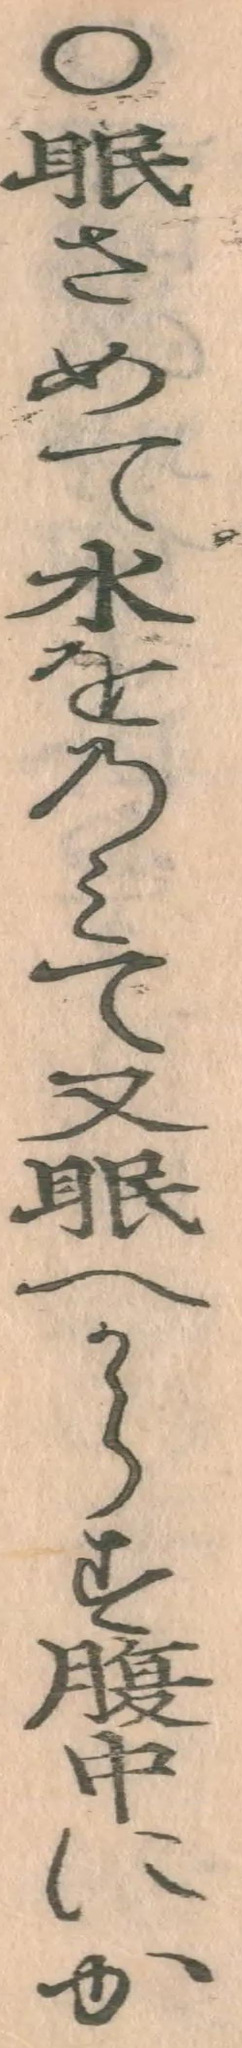〇眼さめて水をのみて又眠へからす腹中にか
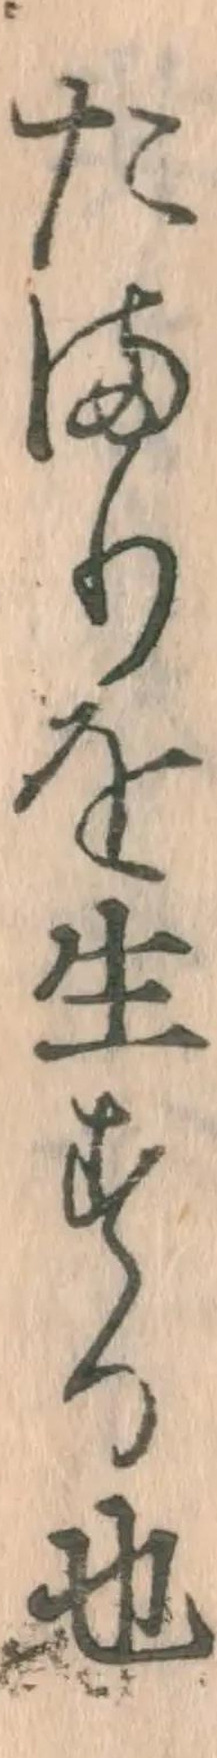たまりを生する也
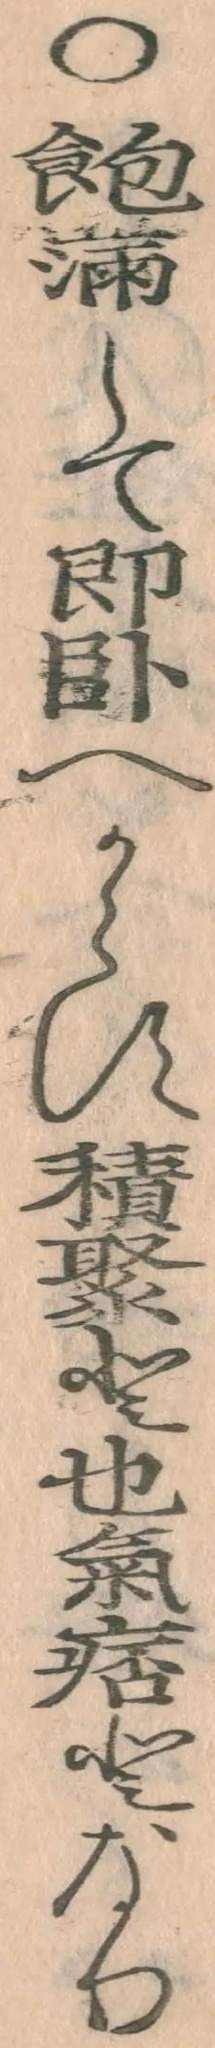〇飽満して即臥へからす積聚と也気痞となり
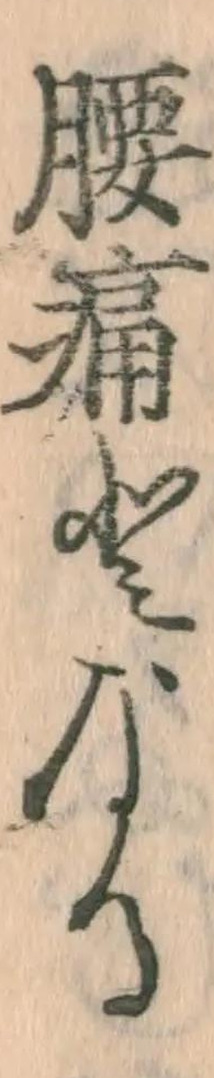腰痛となる
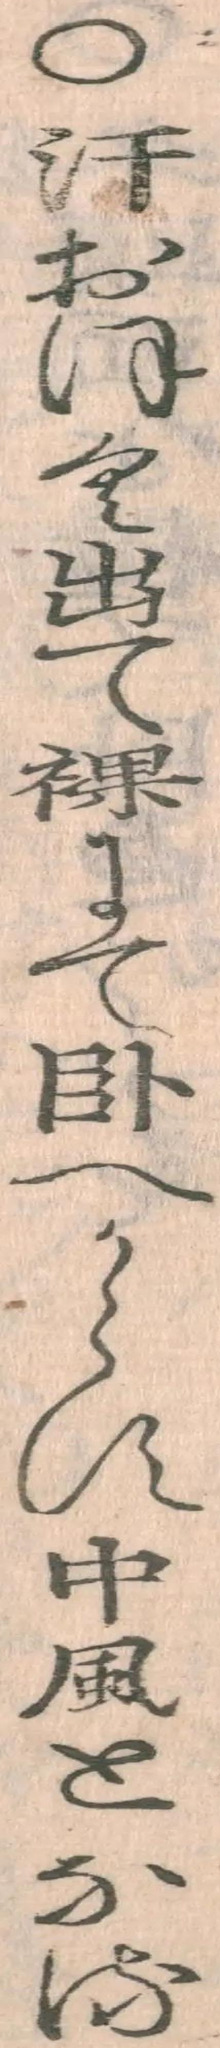〇汗おほく出て裸にて臥へからす中風となる
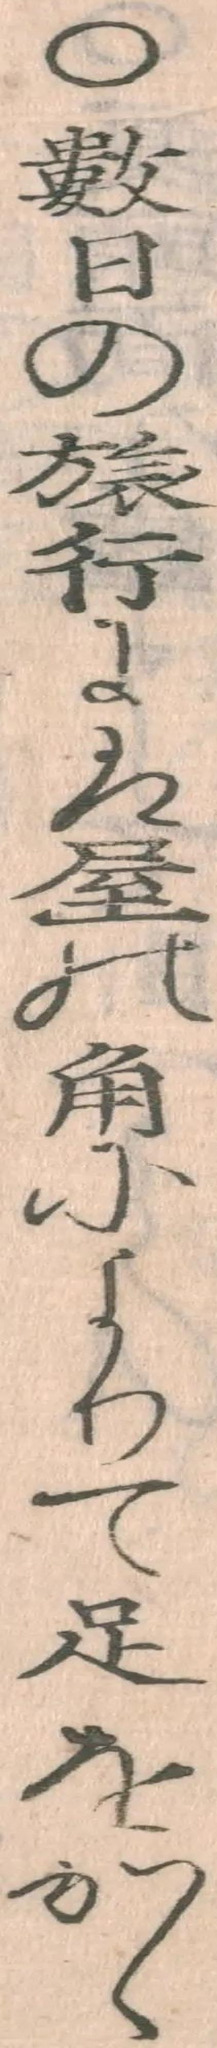〇数日の旅行には屋の角によりて足をかゝ
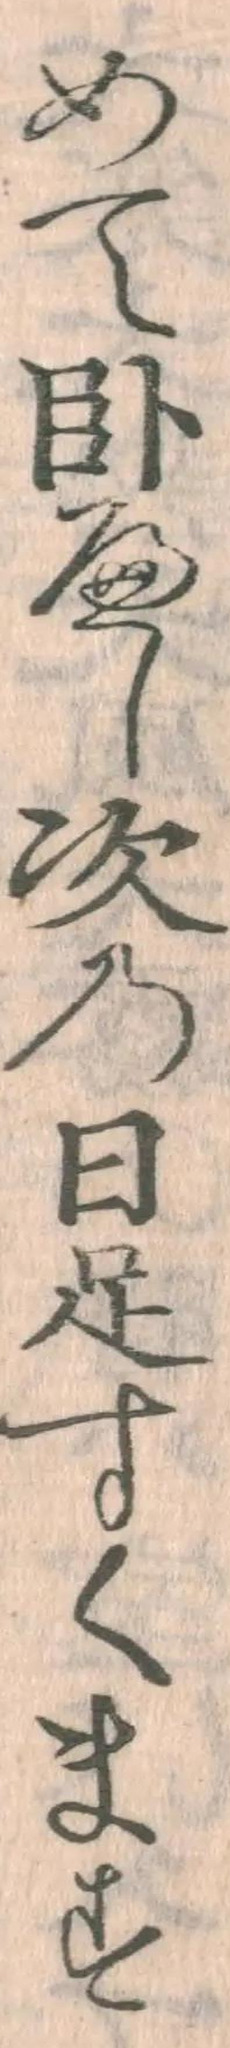めて臥へし次の日足すくます
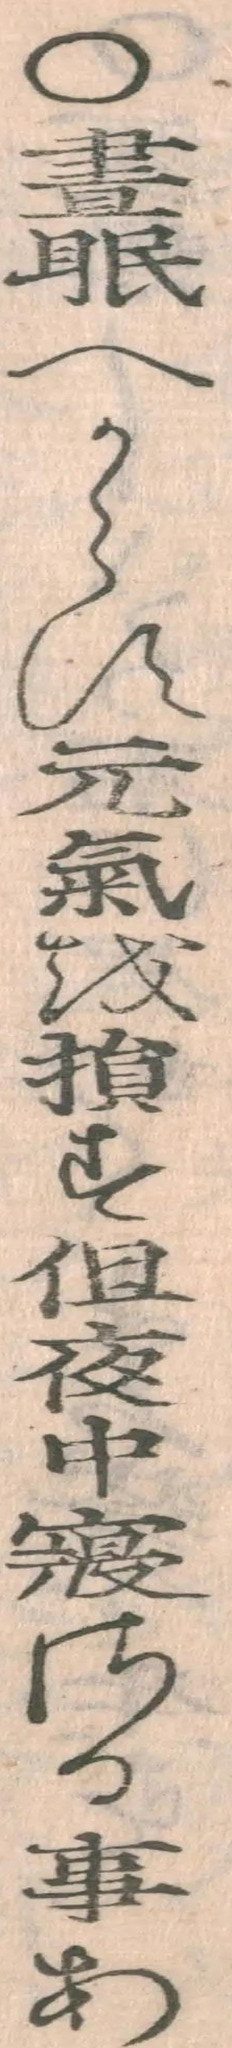〇昼眠へからす元気を損す但夜中寝さる事あ
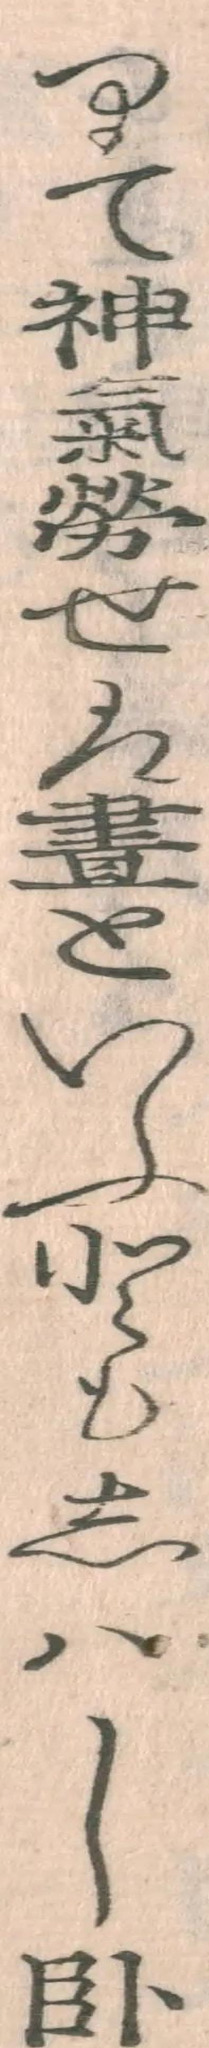りて神気労せは昼といふともしはし臥
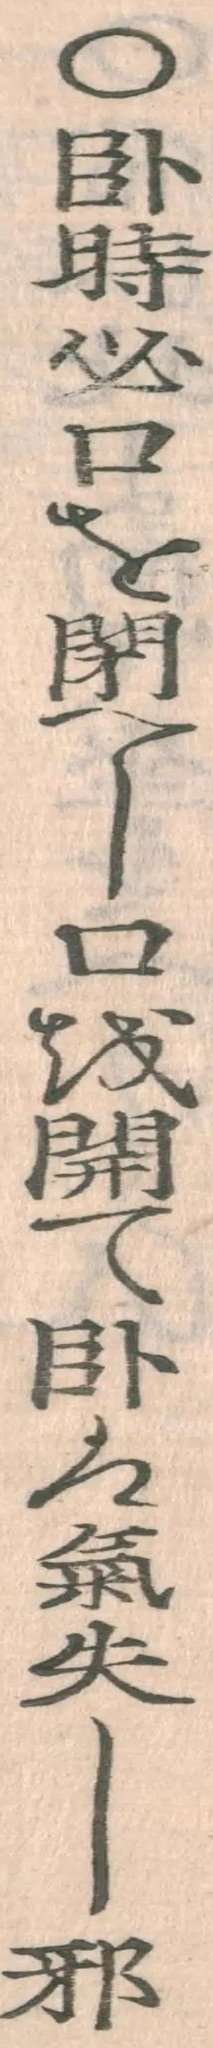〇臥時必口を閉へし口を開て臥は気失し邪
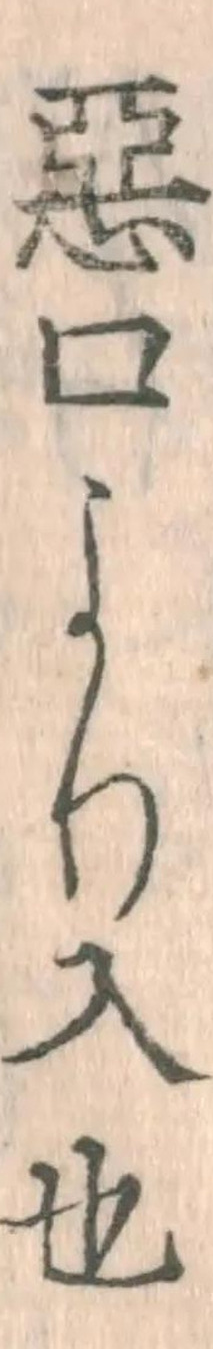悪口より入也
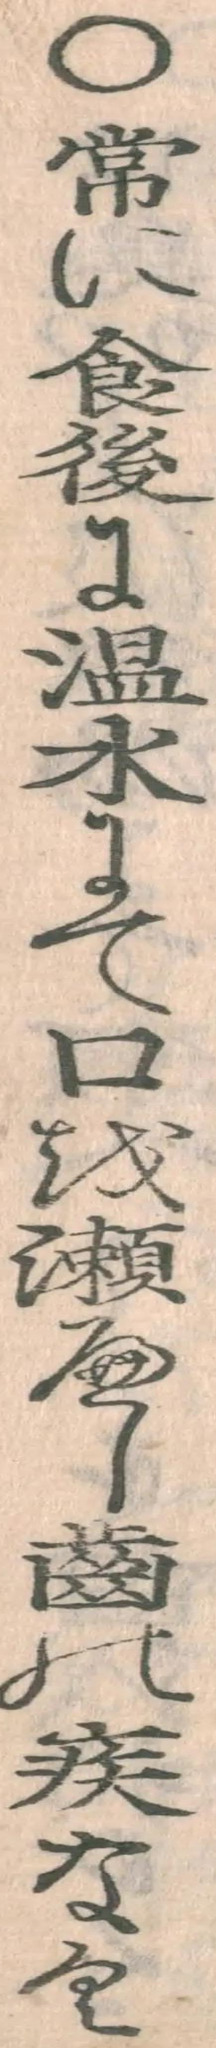〇常に食後に温水にて口を瀬へし歯の疾なく

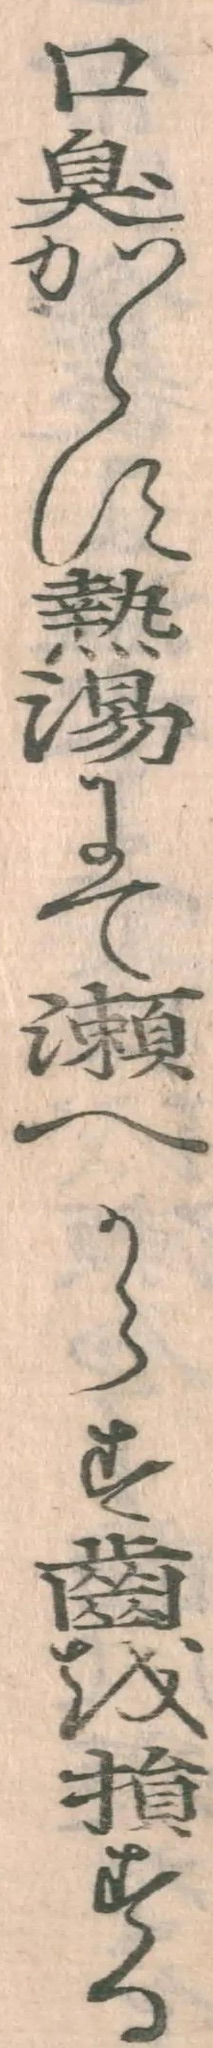口臭からす熱湯にて瀬へからす歯を損する
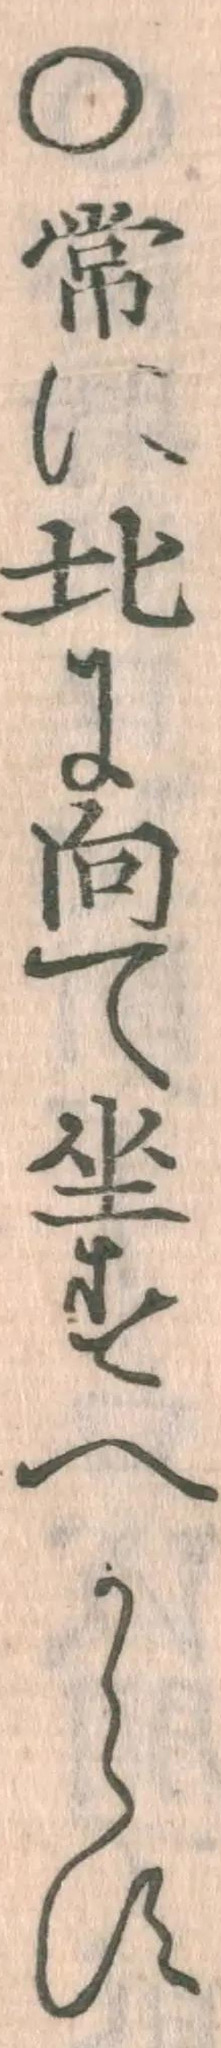〇常に北に向て坐すへからす
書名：延壽撮要
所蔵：国立国会図書館 National Diet Library, JAPAN
